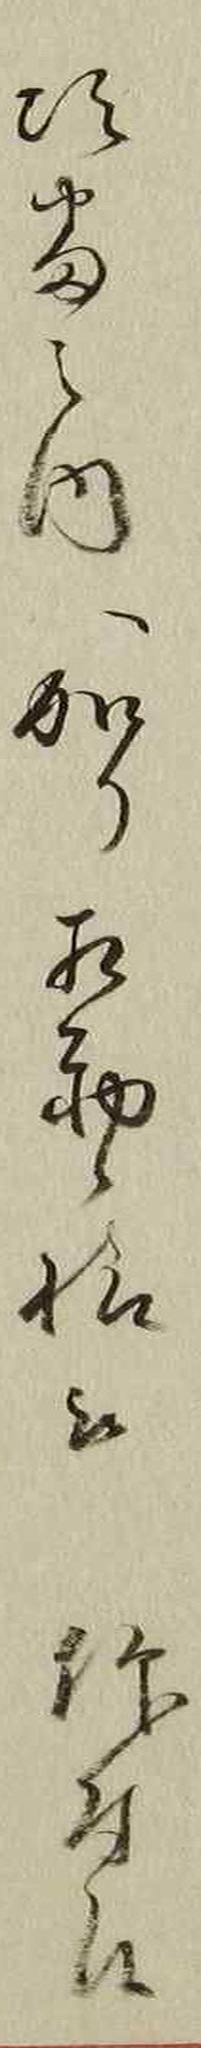次番之内へ加り相勤候様被仰付候
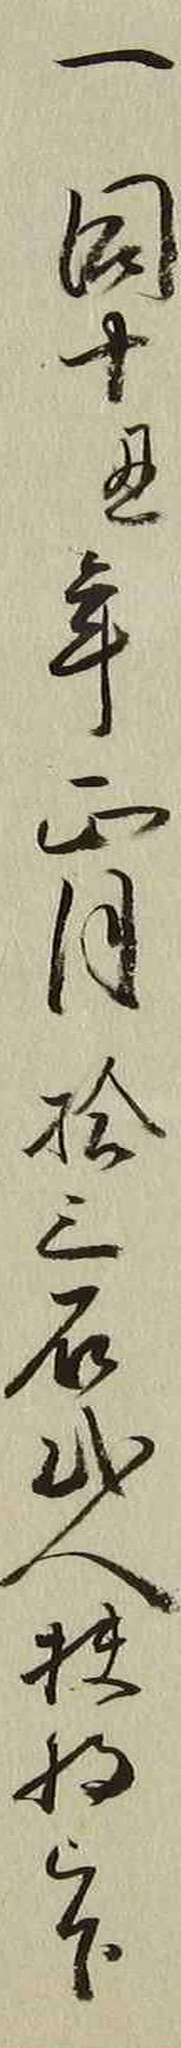一同十丑年正月拾三石弐人扶持被下
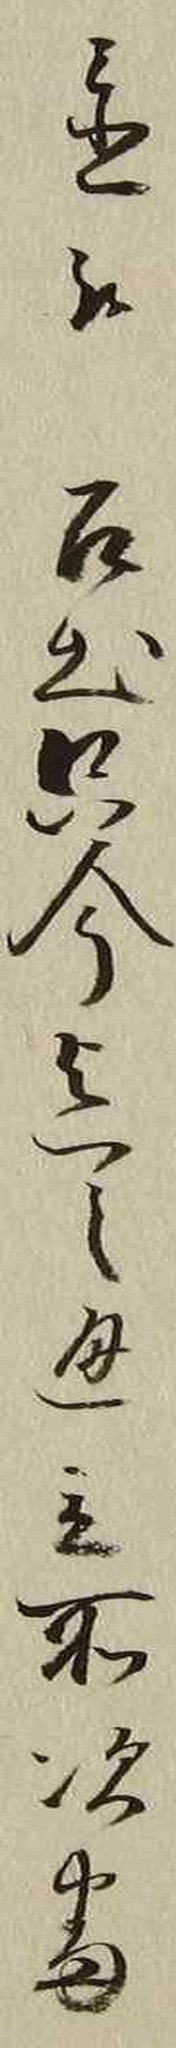置被召出只今迄之通立所次番
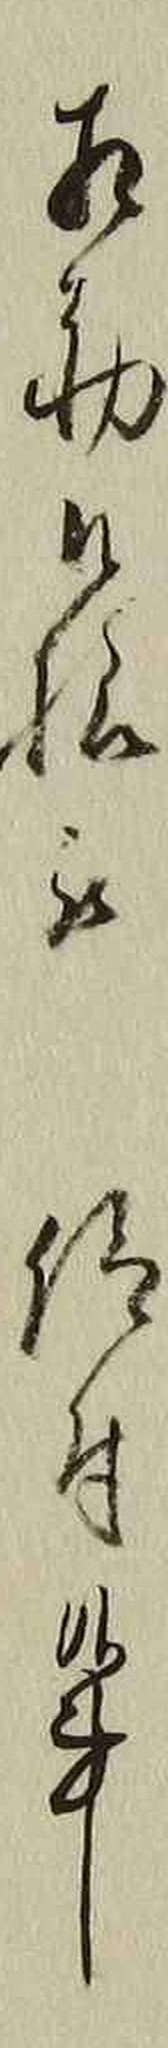相勤候様被仰付候事
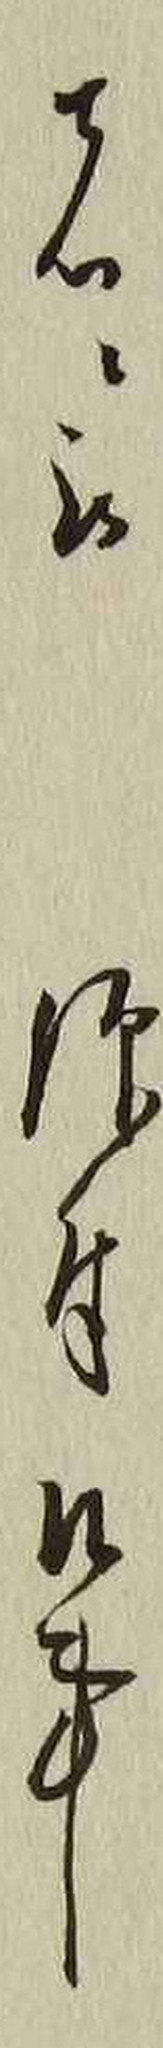者ニ被仰付候事
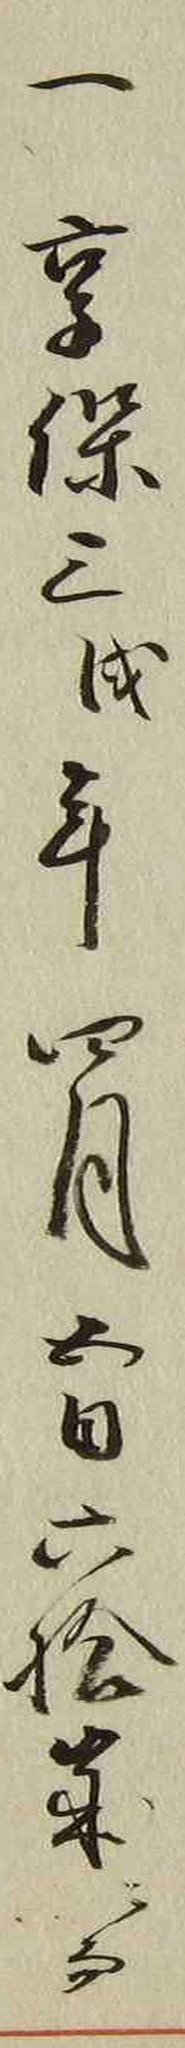一享保三戌年四月五日六拾歳ニ而
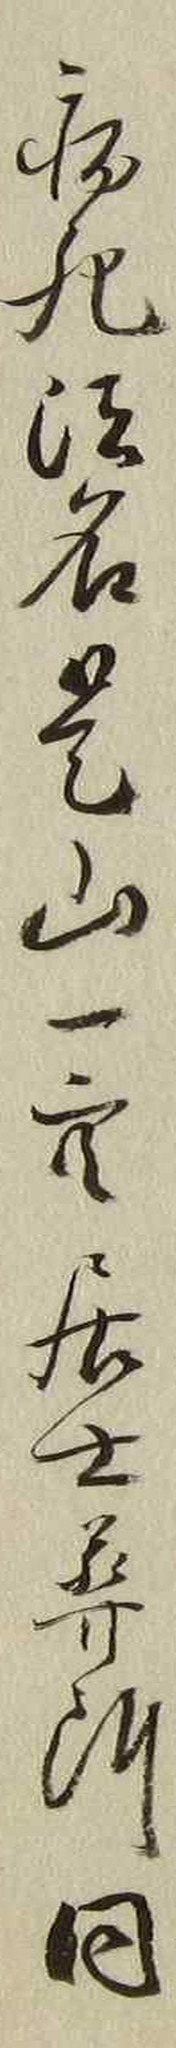病死法名是山一空居士葬所同

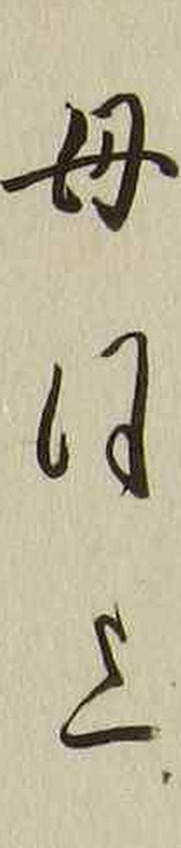母同上
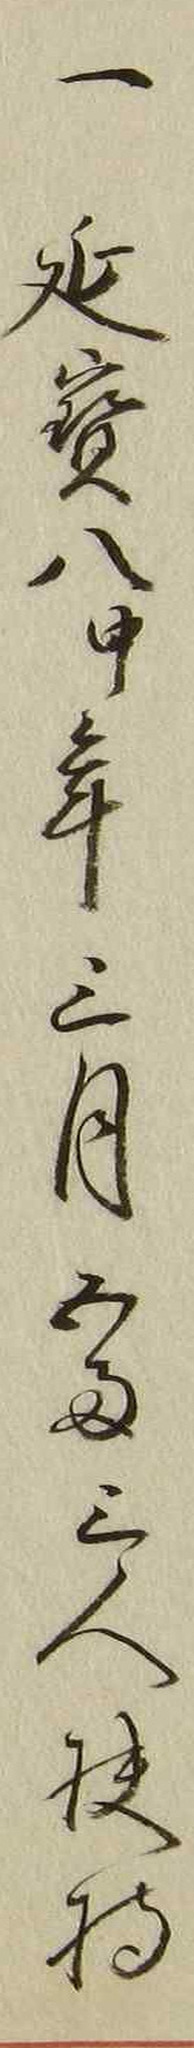一延宝八申年三月五両三人扶持
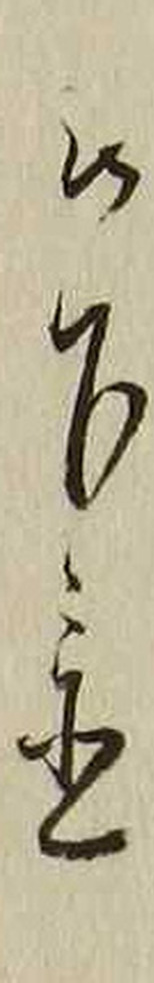被下置
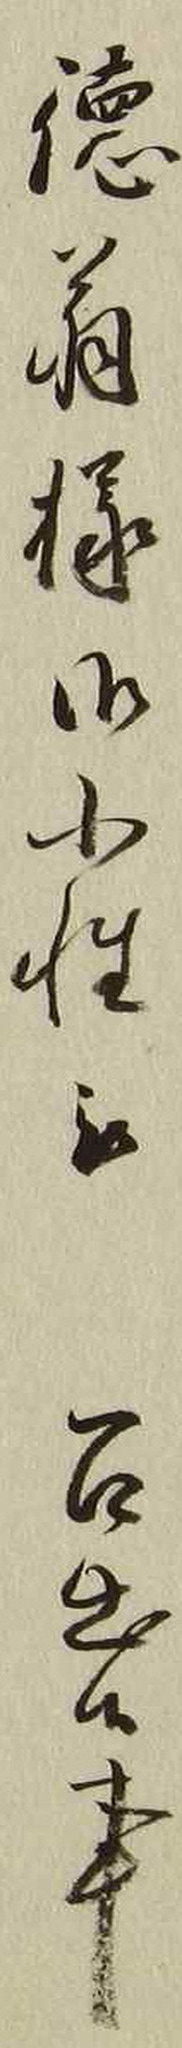徳翁様御小性被召出候事
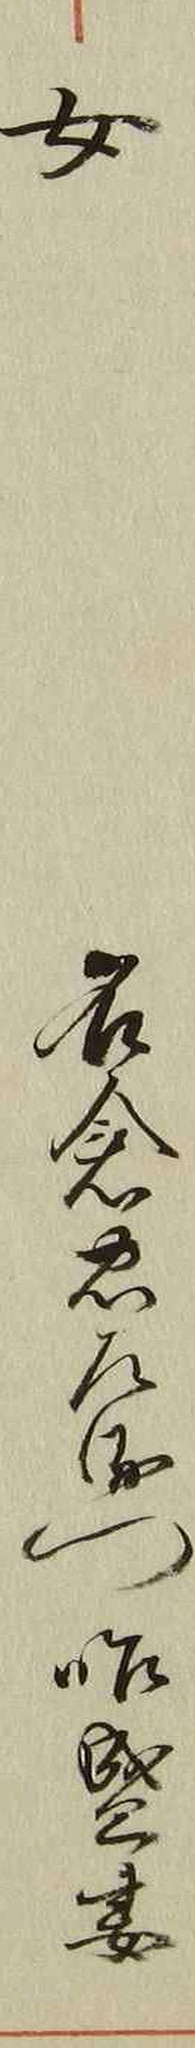女名倉忠左衛門昨盛妻
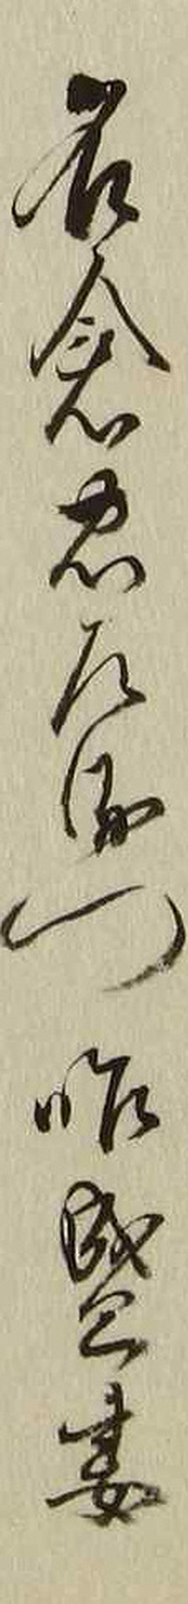女名倉忠左衛門昨盛妻
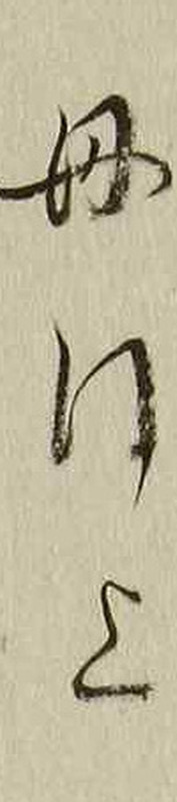母同上
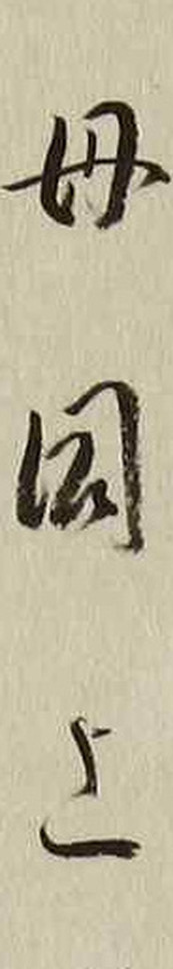母同上
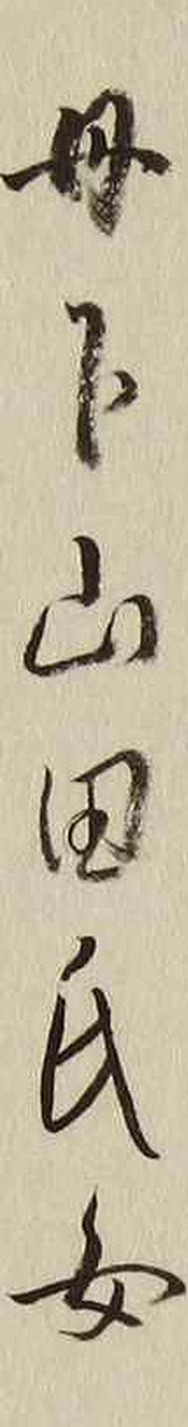母下山田氏女
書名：諸士系譜　巻之32　い之部32
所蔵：会津若松市立会津図書館
